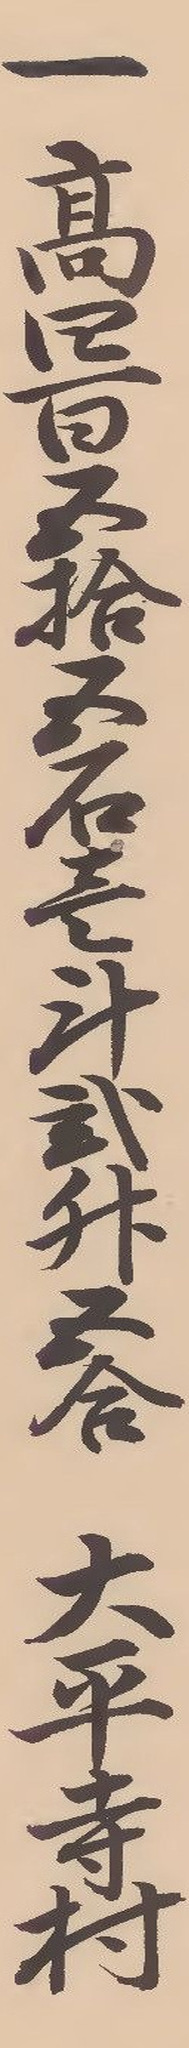一高四百五拾五石壱斗弐升五合大平寺村

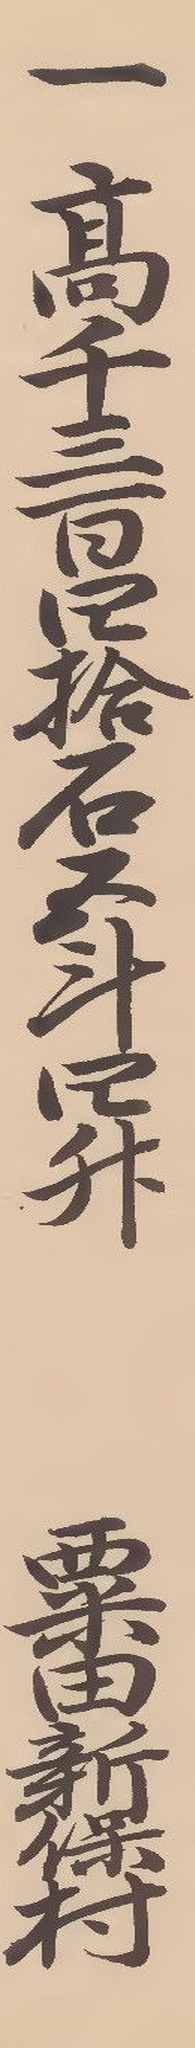一高千三百四拾石五斗四升粟田新保村
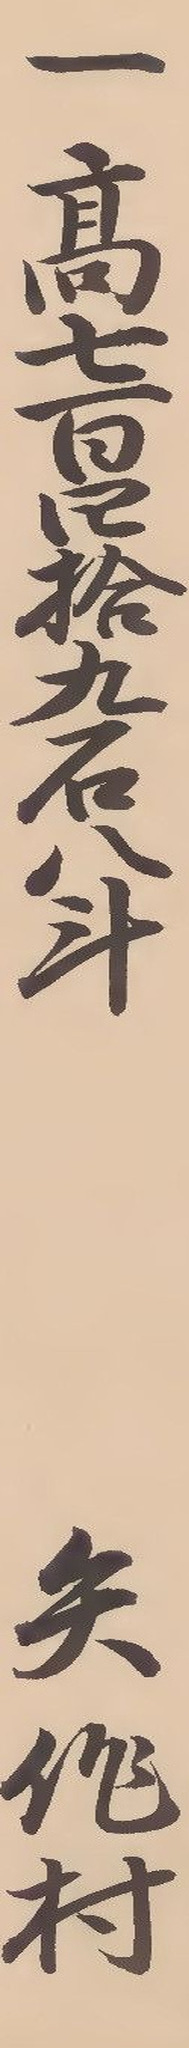一高七百四拾九石八斗矢作村

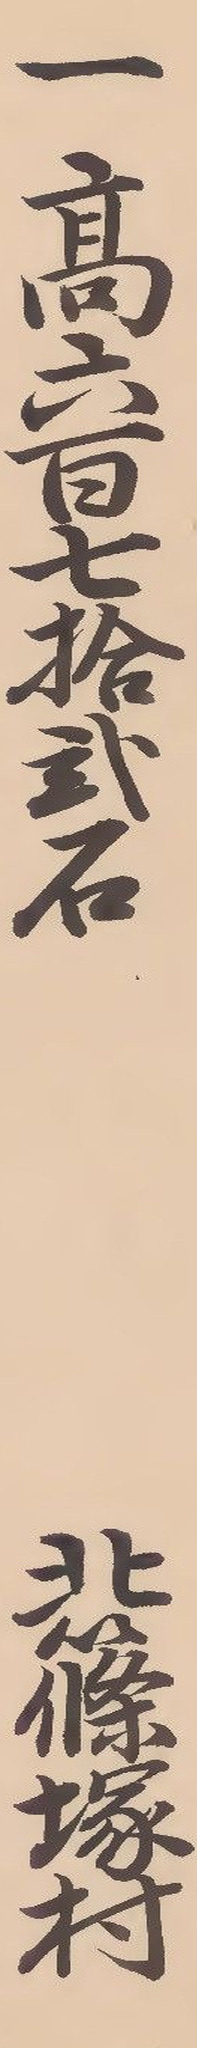一高六百七拾弐石北篠塚村
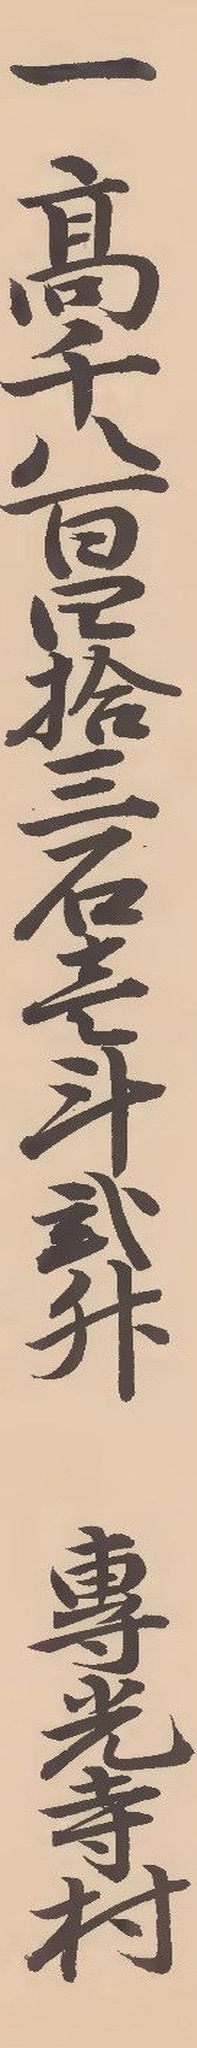一高千八百四拾三石壱斗弐升専光寺村
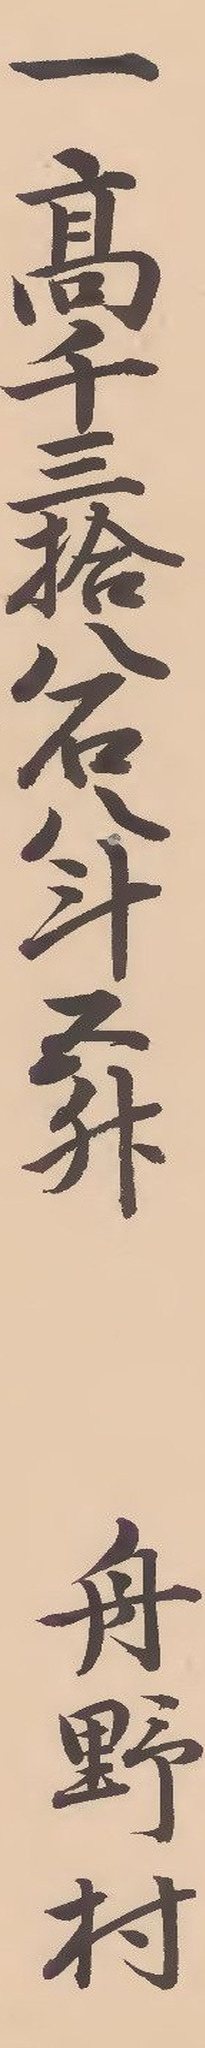一高千三拾八石八斗五升舟野村

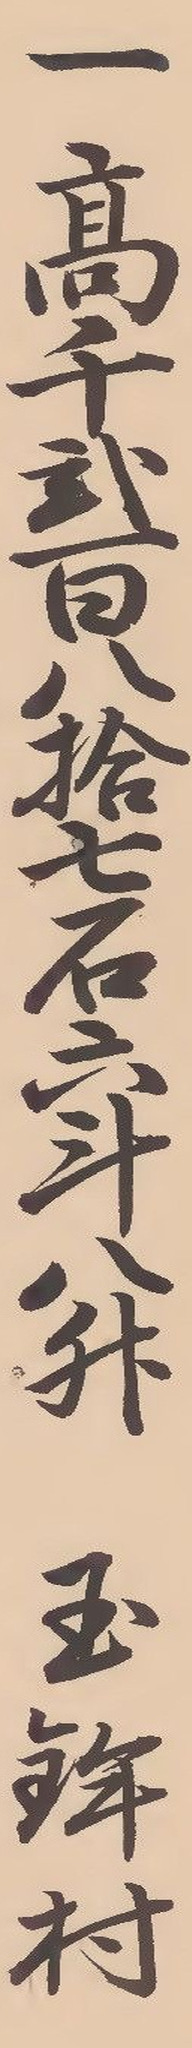一高千弐百八拾七石六斗八升玉鉾村
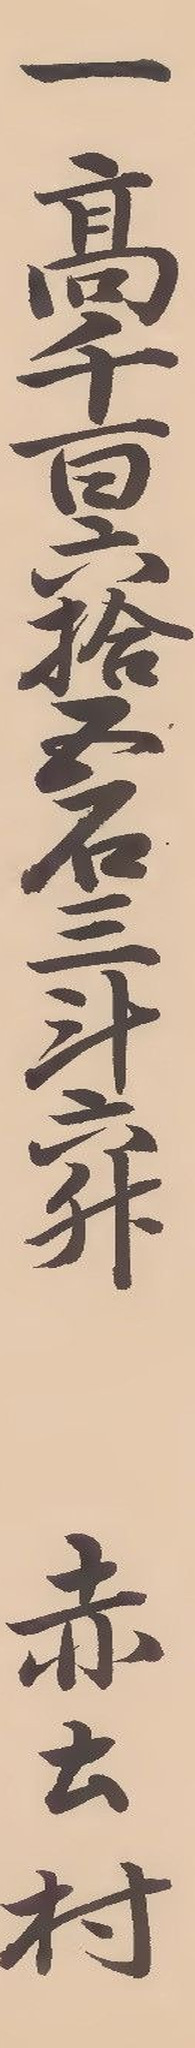一高千百六拾五石三斗六升赤土村
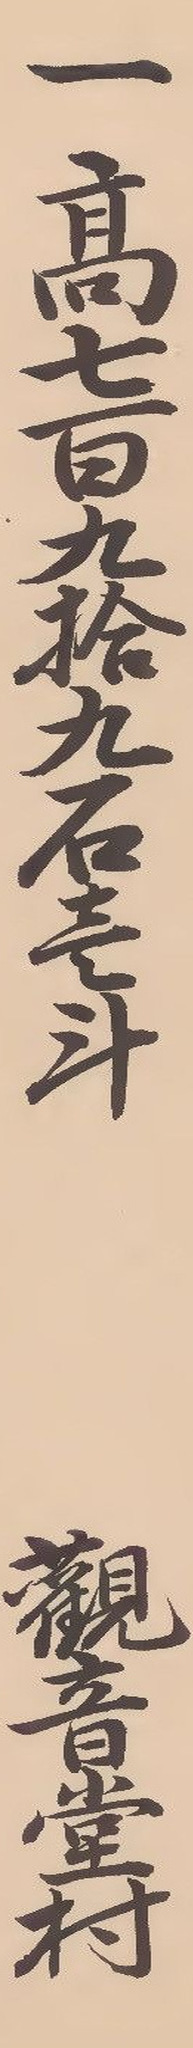一高七百九拾九石壱斗観音堂村
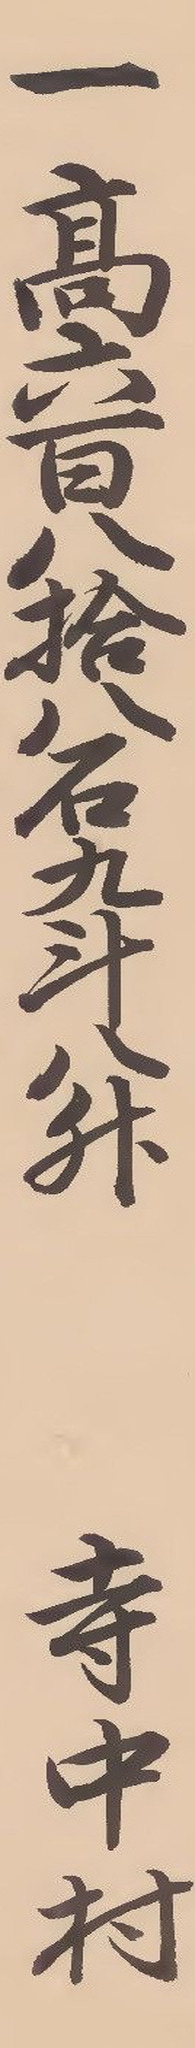一高六百八拾八石九斗八升寺中村
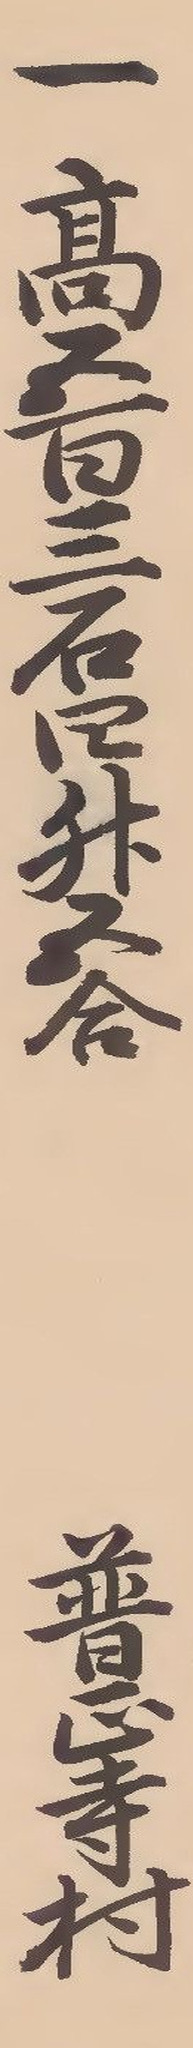一高五百三石四升五合普正寺村
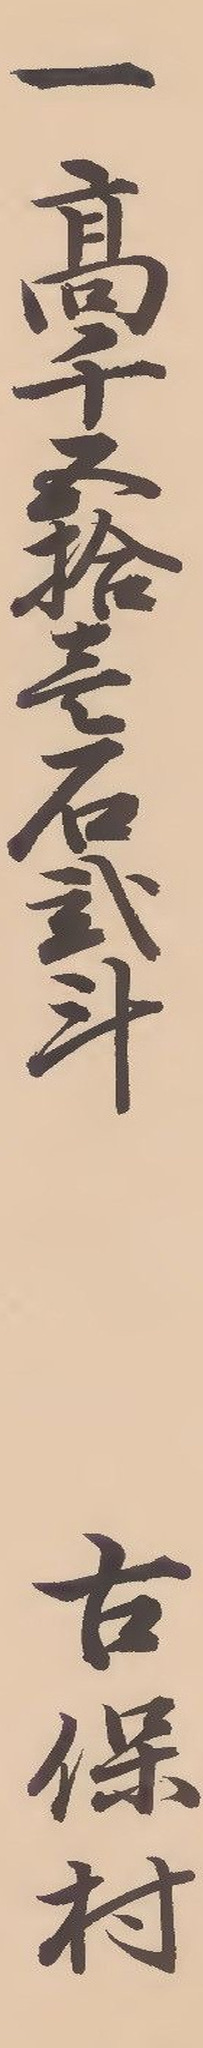一高千五拾壱石弐斗古保村

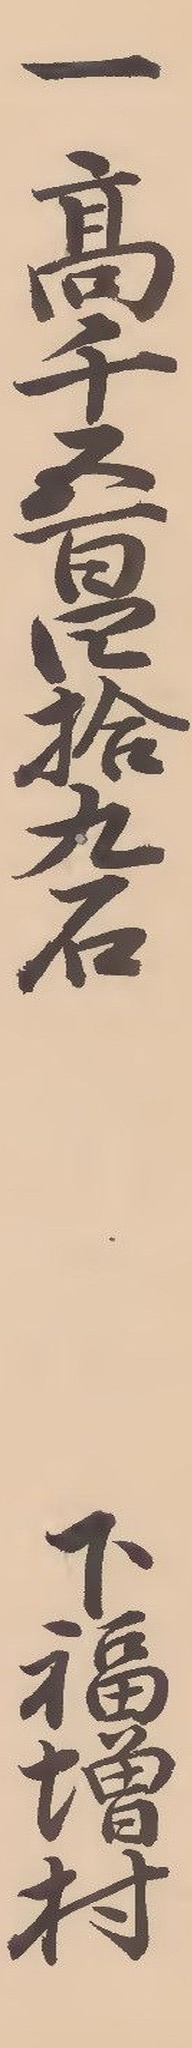一高千五百四拾九石下福増村
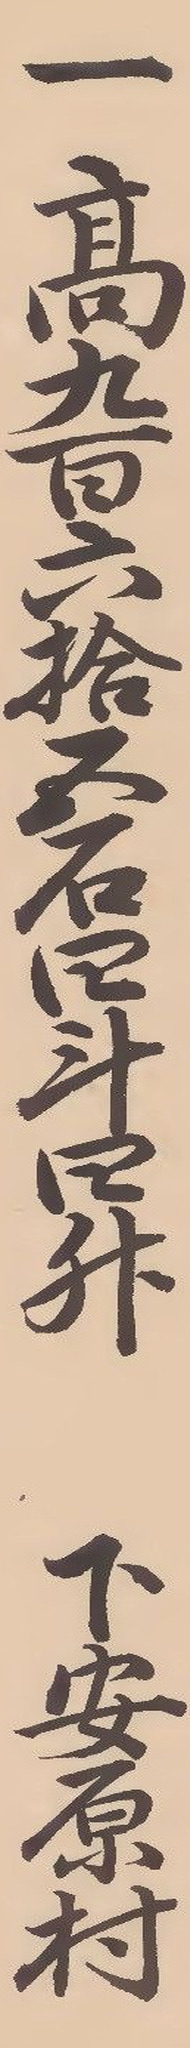一高九百六拾五石四斗四升下安原村
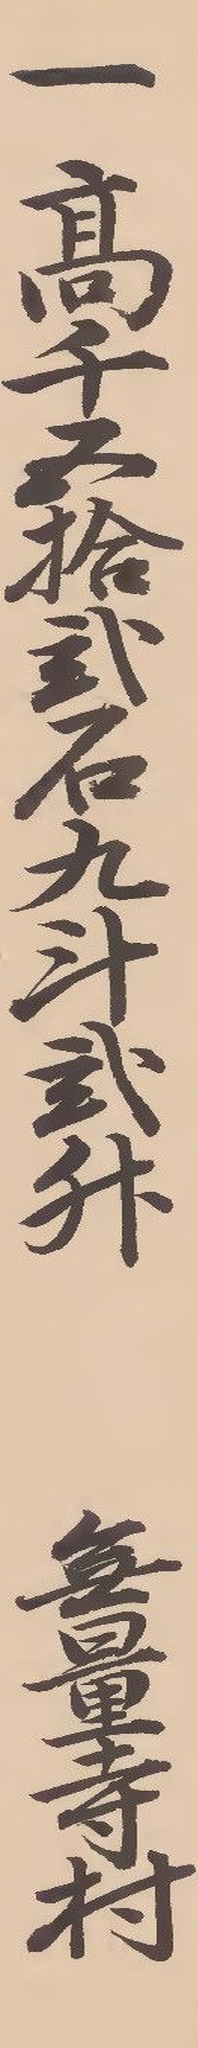一高千五拾弐石九斗弐升無量寺村
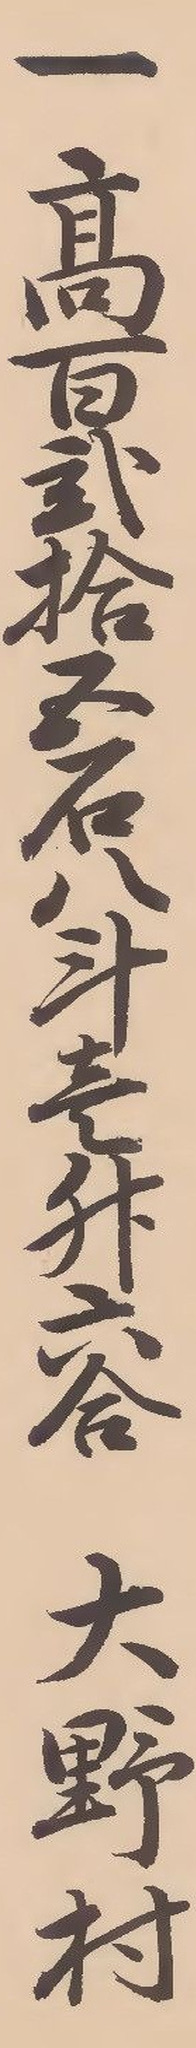一高百弐拾五石八斗壱升六合大野村
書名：加賀国郷帳
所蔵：国立公文書館 National Archives of Japan
